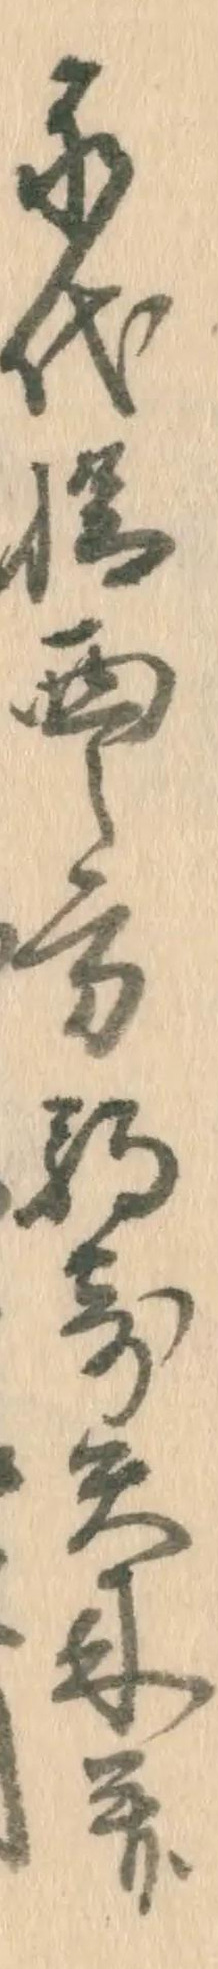永代橋西之方駒寄矢来并
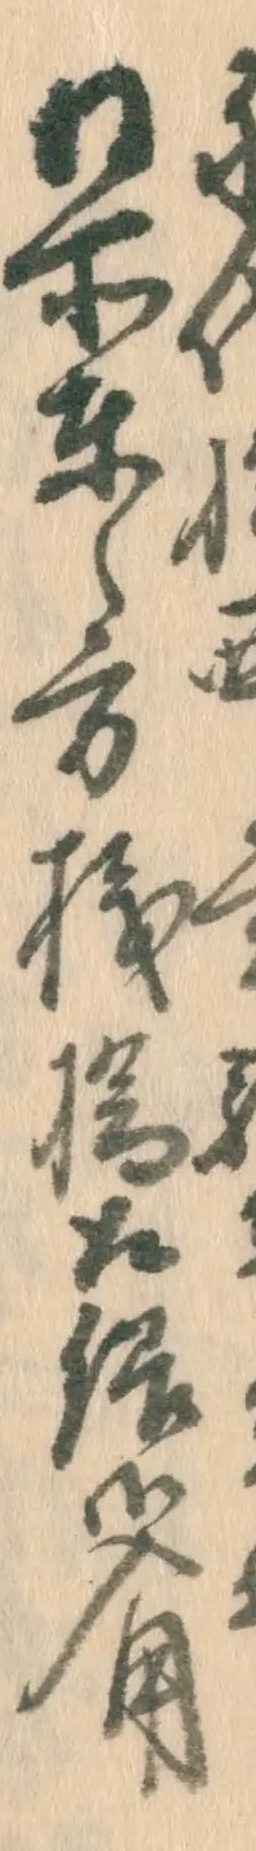同所東之方桟橋取繕御入用
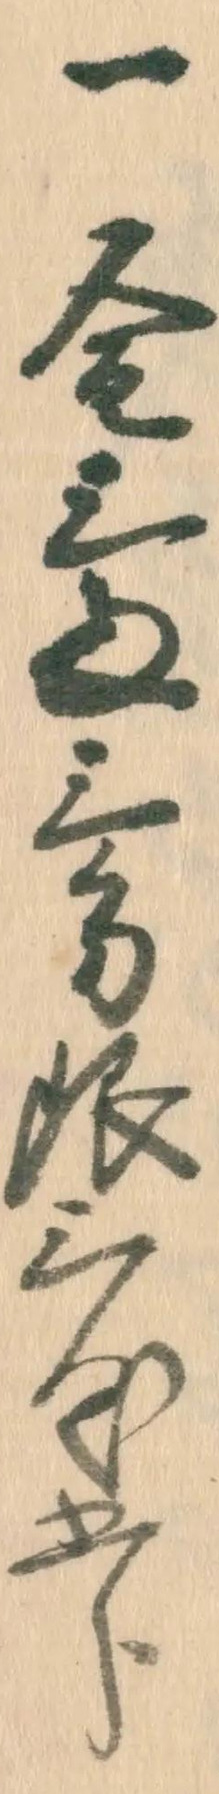一金三両三分銀三匁五分
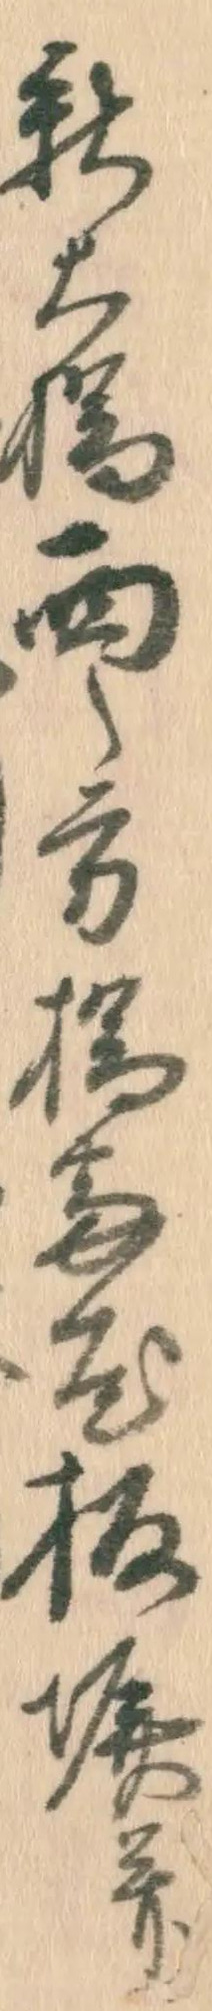新大橋西之方橋番屋板塀并
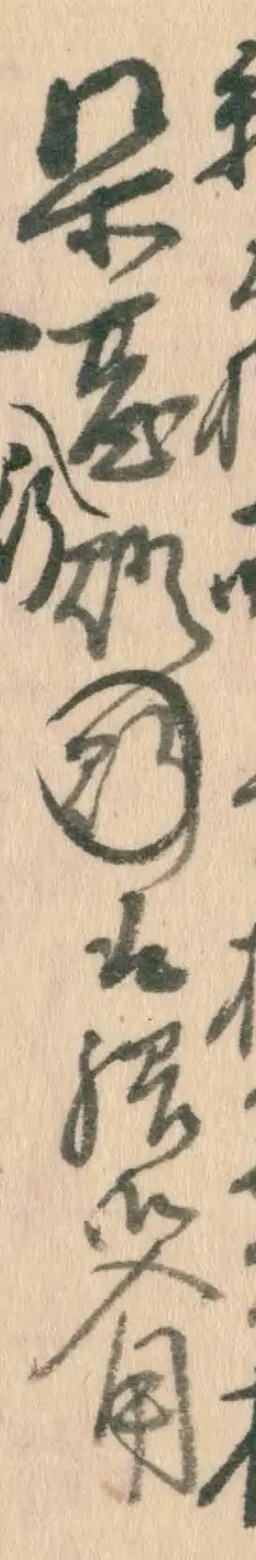同所台行灯取繕御入用
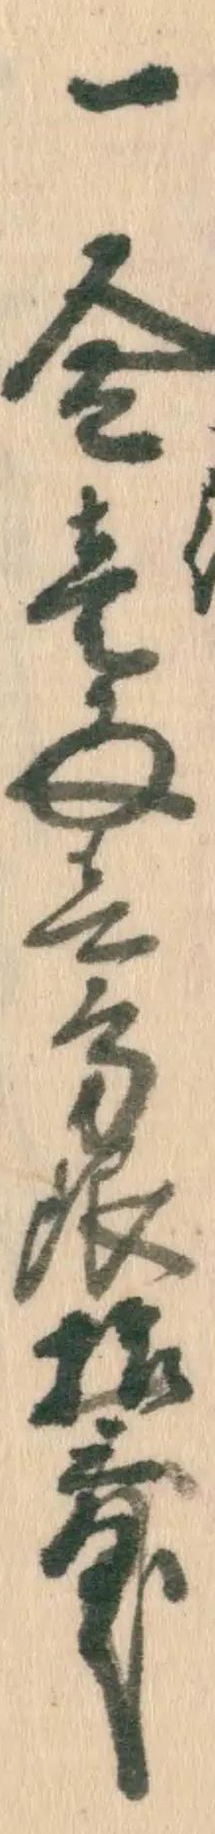一金壱両壱分銀拾三匁
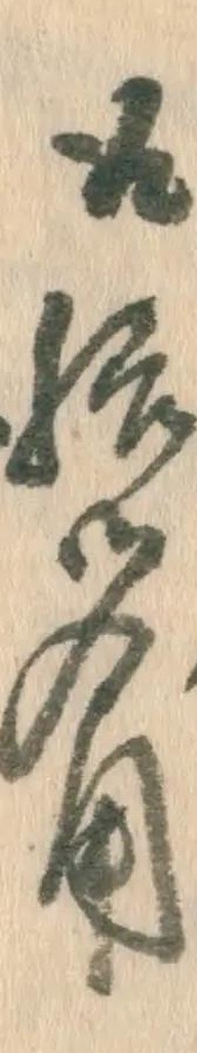取繕御入用
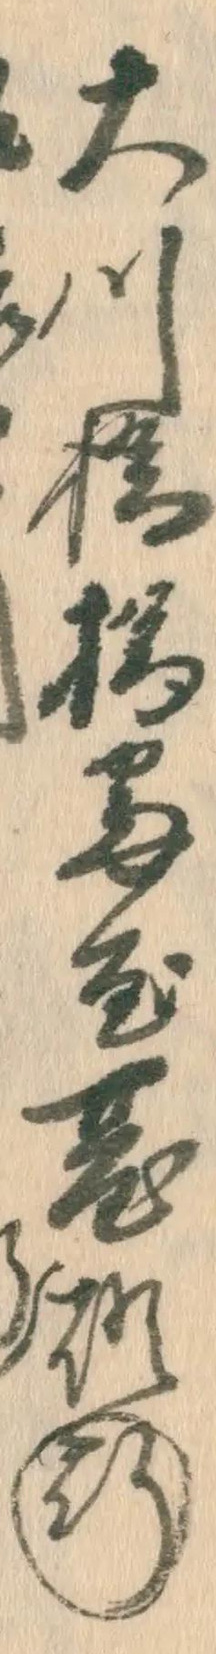大川橋橋番屋台行灯
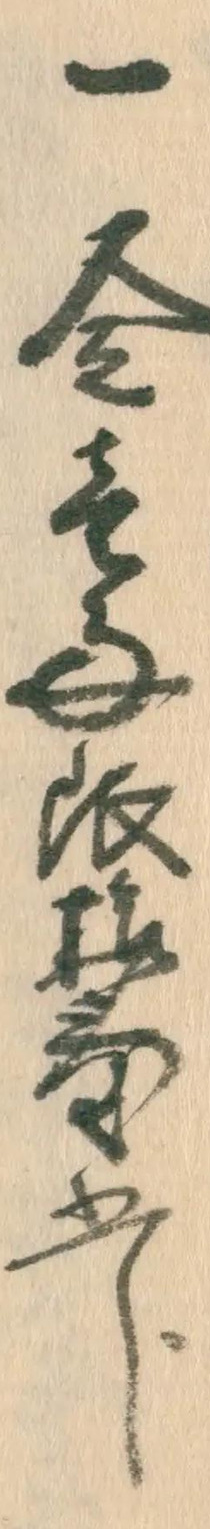一金壱両銀拾三匁五分
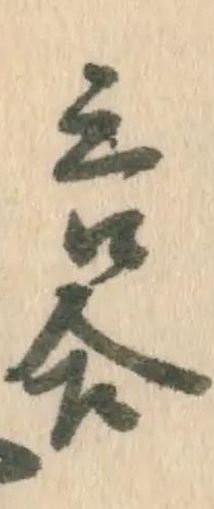三口合
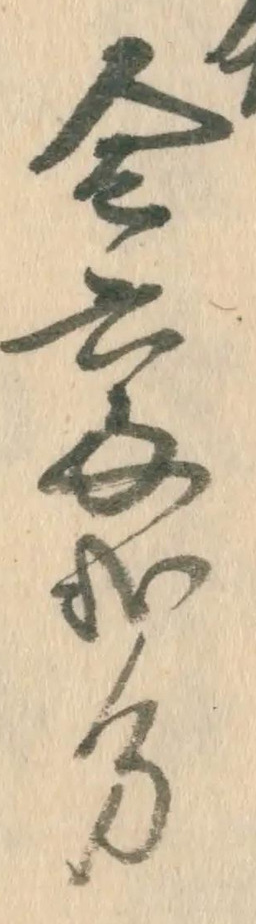金六両弐分

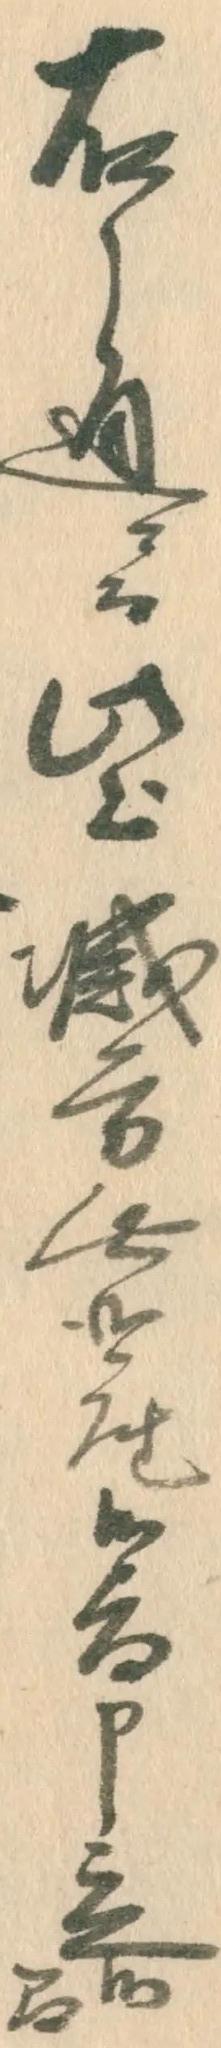右之通ニ而此上減方無御座候旨申立候間
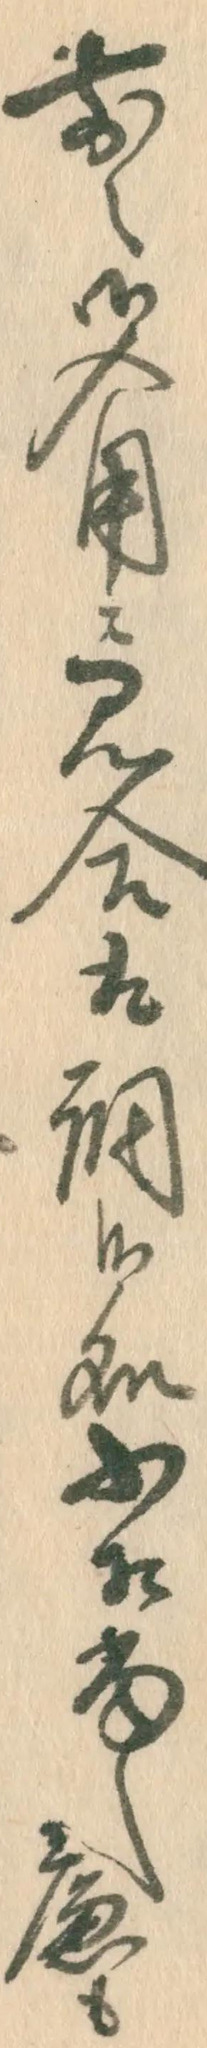前之御入用ニ見合取調候処不相当之廉も
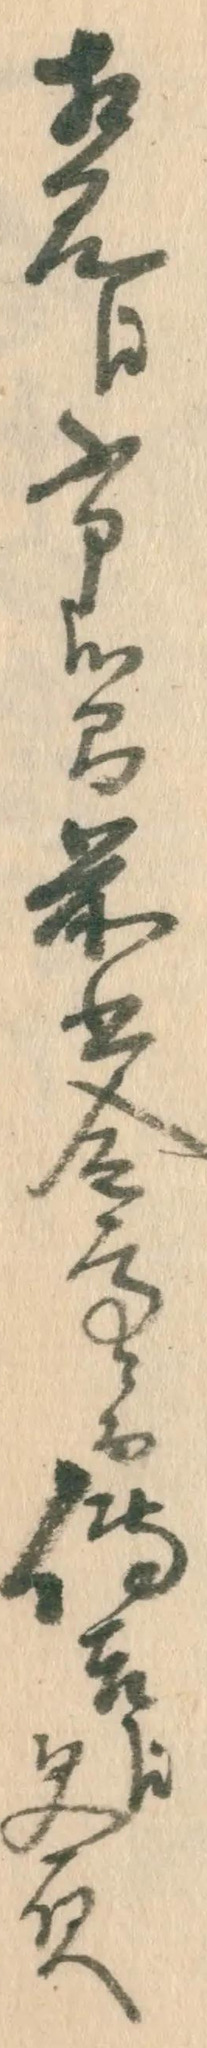相見え不申候間前書金高ニ而伝吉え受負
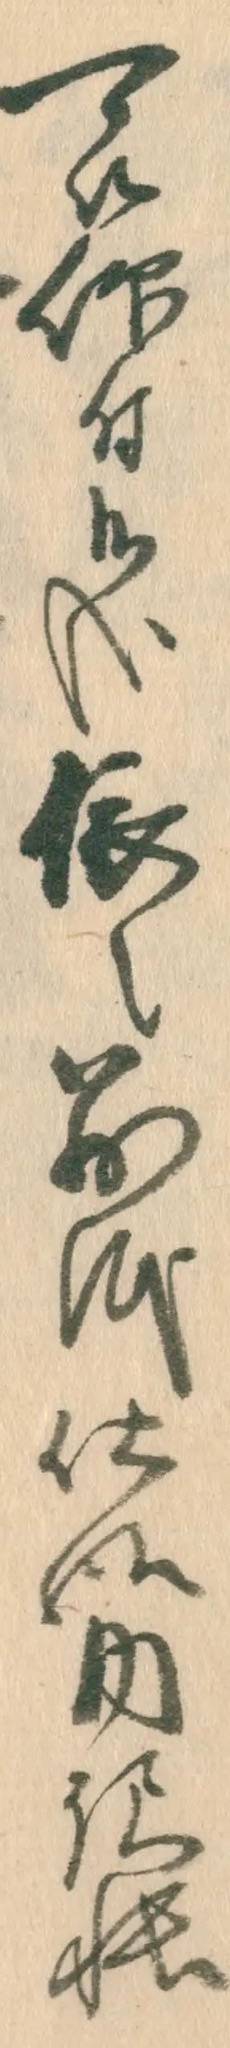可被仰付候哉依之別紙仕様内訳帳
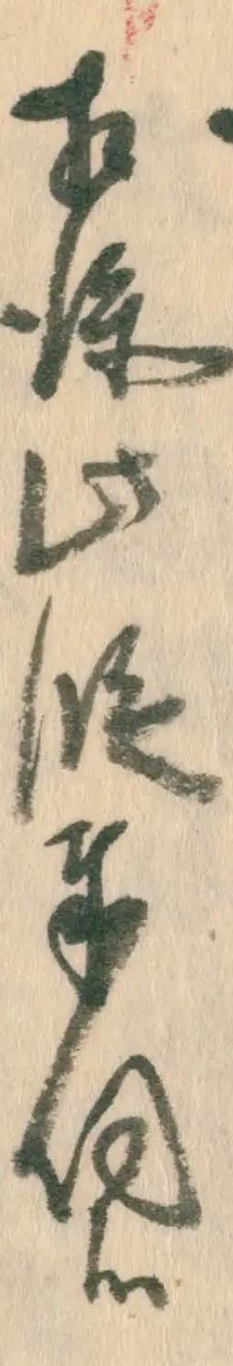相添此段奉伺候
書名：三橋 17巻. [8] 三橋小破御修復書留　但御奉行御掛リ替地震潰橋番屋　嘉永四亥年より安政二卯年迄　下
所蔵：国立国会図書館 National Diet Library, JAPAN
